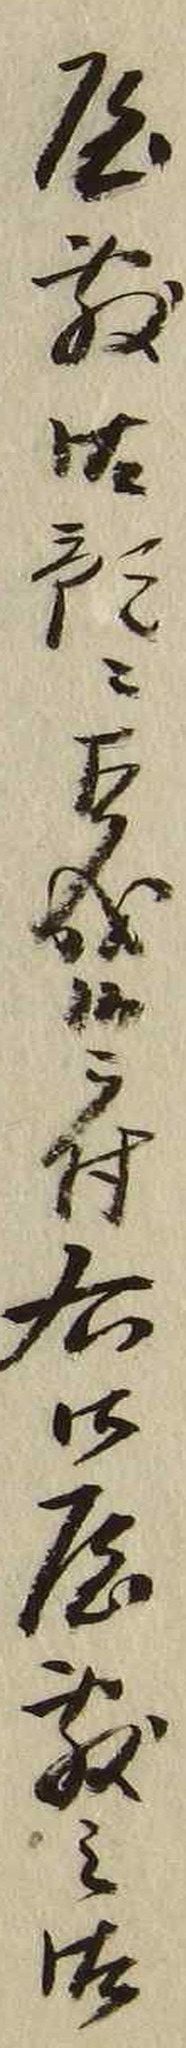屋敷御預ニ相成候ニ付右御屋敷之御
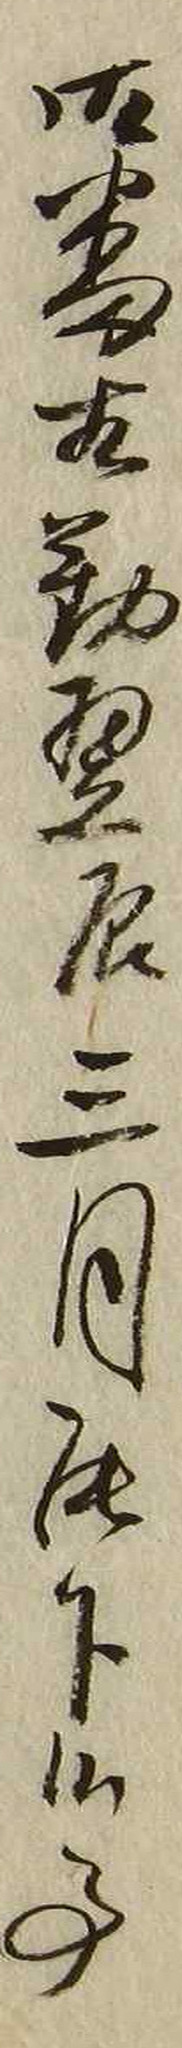御番相勤翌辰三月罷下候事
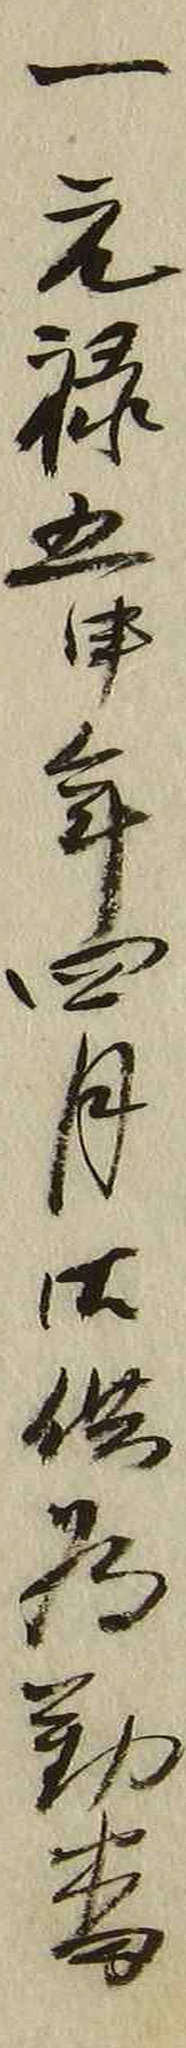一元禄五申年四月御供為勤番
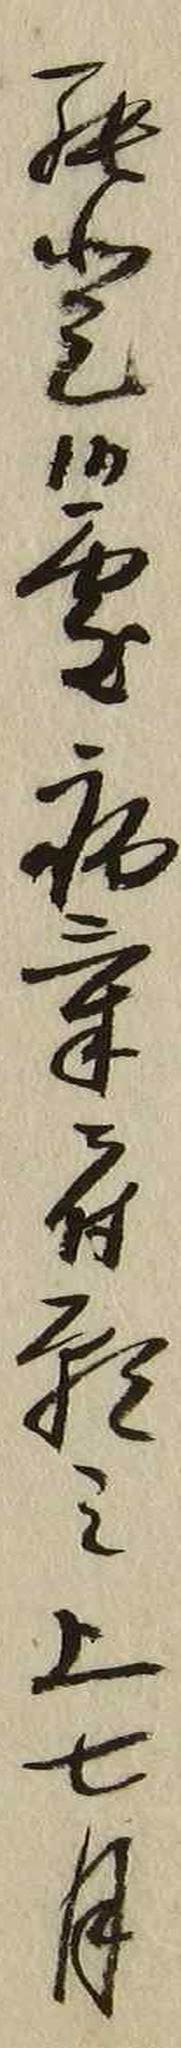罷登候処病気ニ付願之上七月
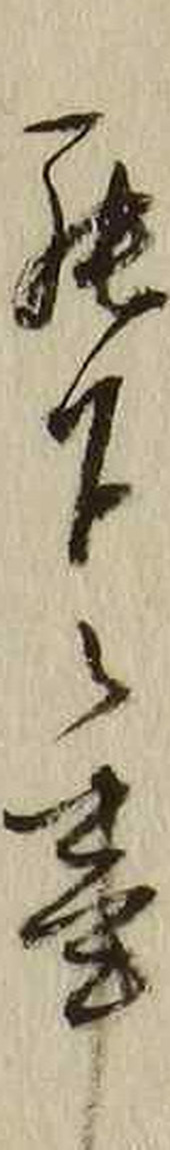罷下候事
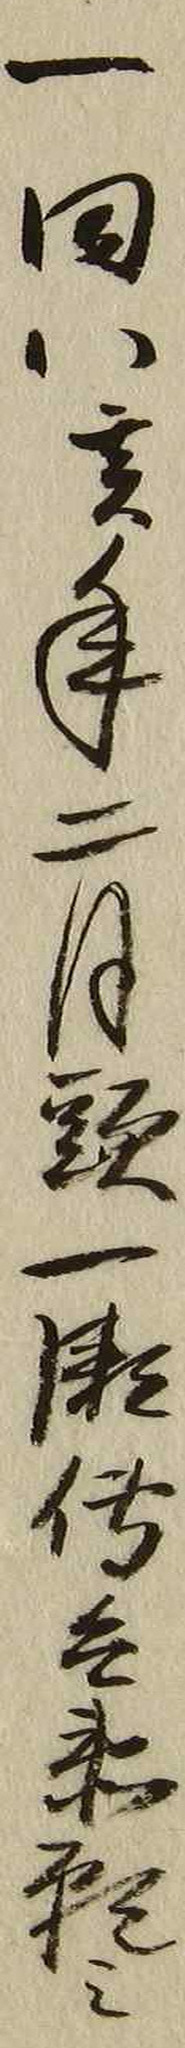一同八亥年二月頭一瀬伝兵衛願之
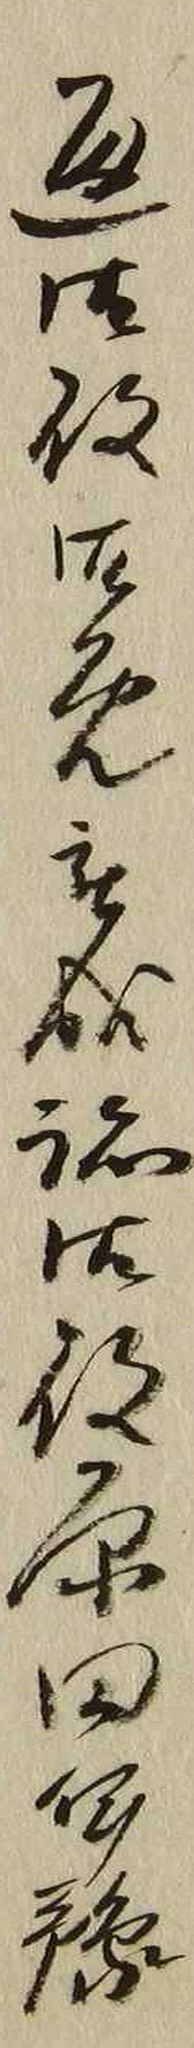通御役御免被成跡御役原田伊予
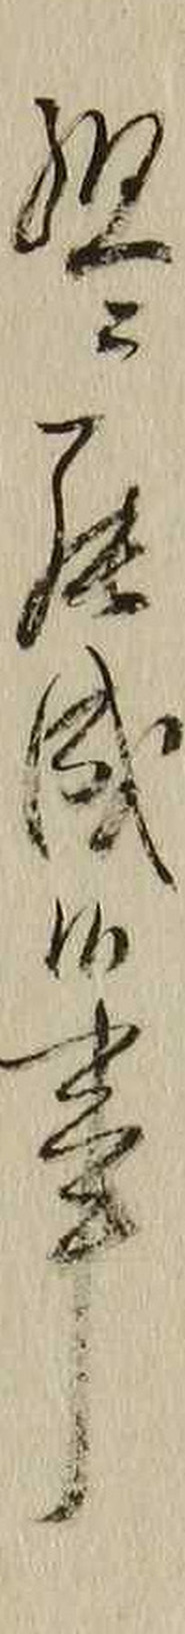組ニ罷成候事
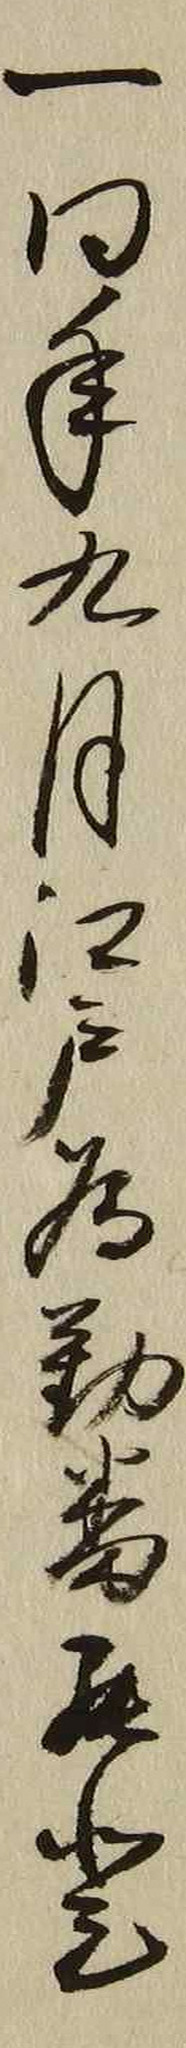一同年九月江戸為勤番罷登
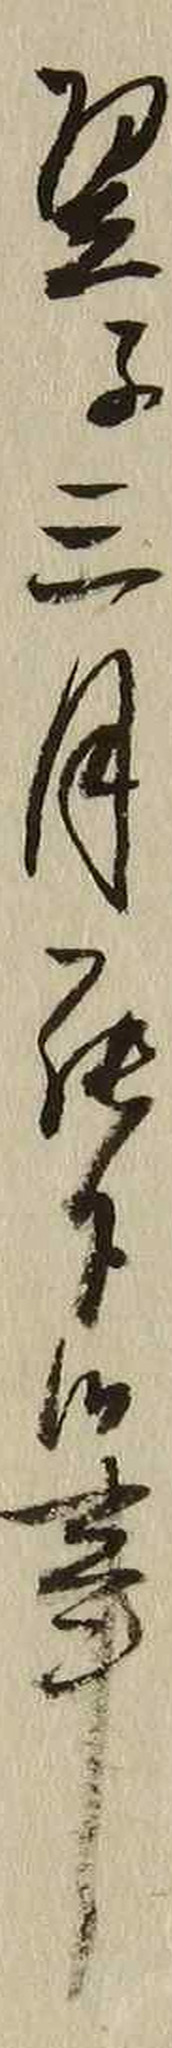翌子三月罷下候事
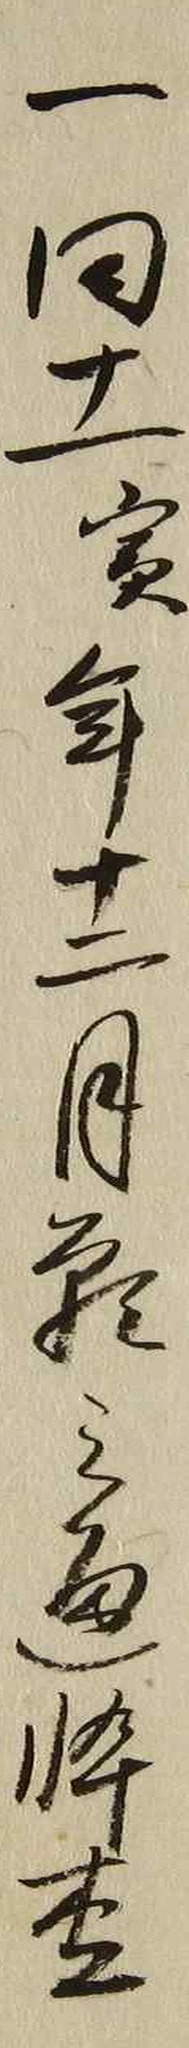一同十一寅年十二月願之通忰杢
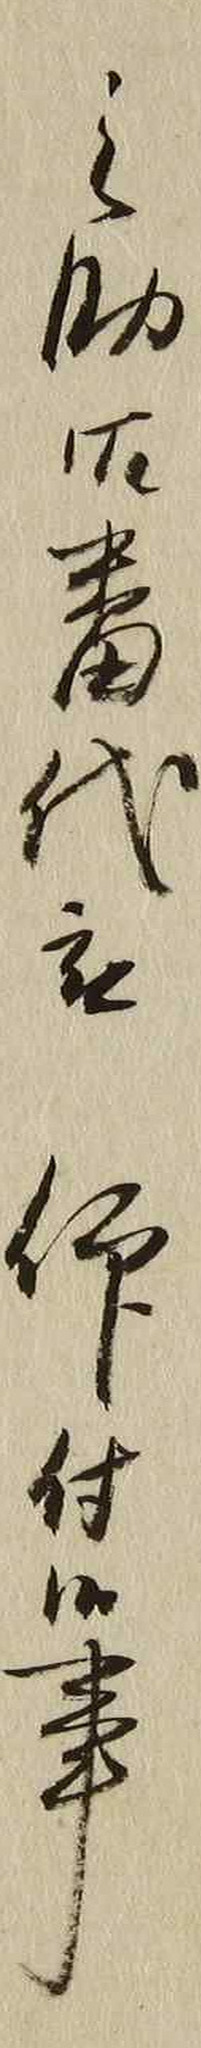之助御番代被仰付候事
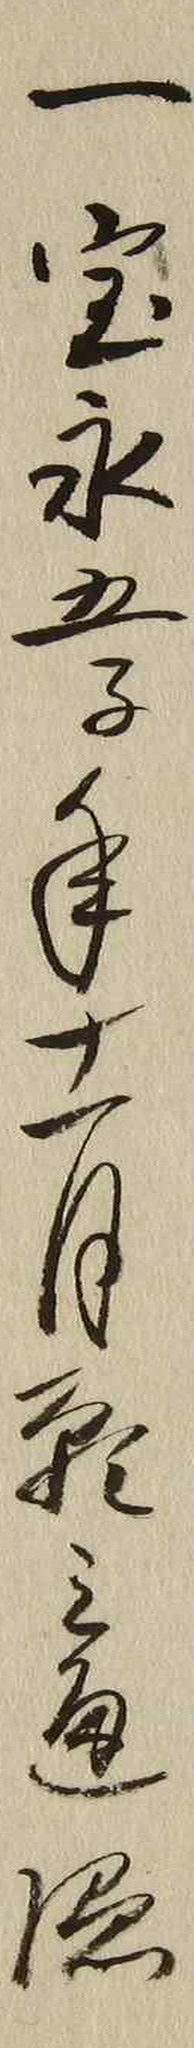一宝永五子年十月願之通隠
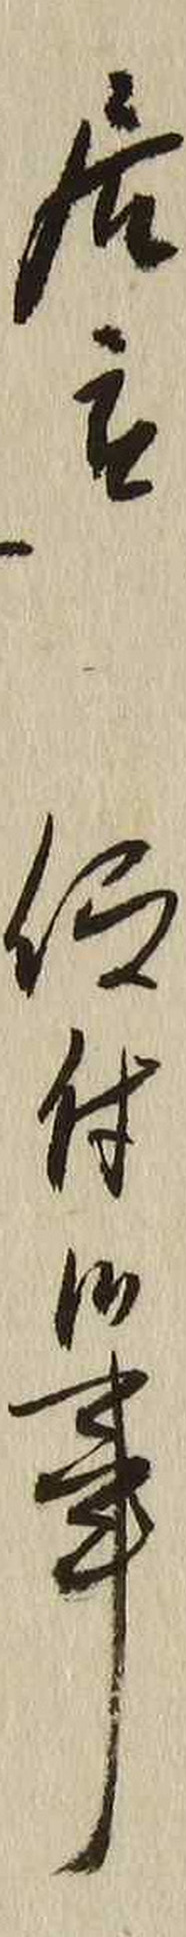居被仰付候事
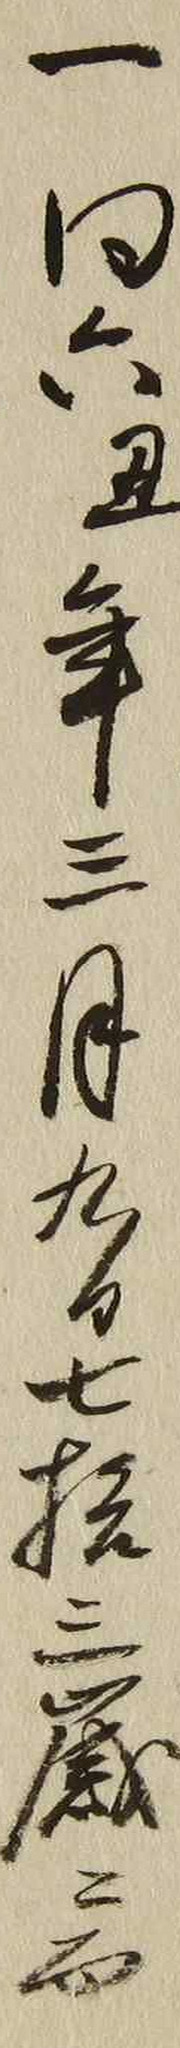一同六丑年三月九日七拾三歳ニ而
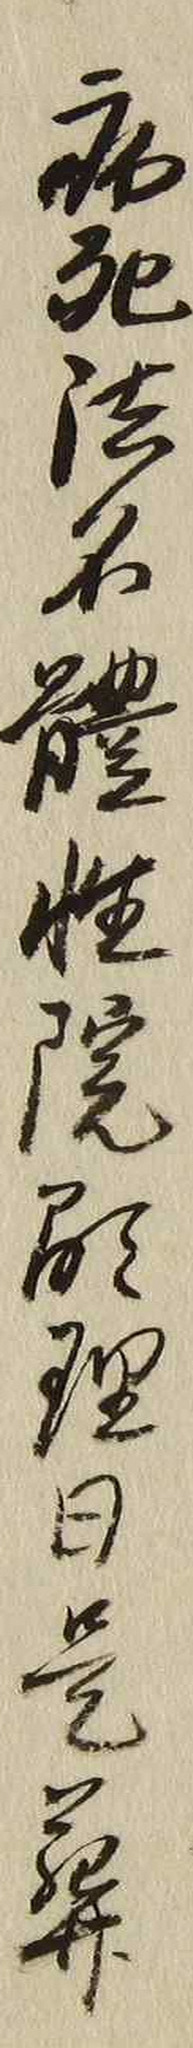病死法名体性院顕理日是葬
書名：諸士系譜　巻之356　す之部6
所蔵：会津若松市立会津図書館
